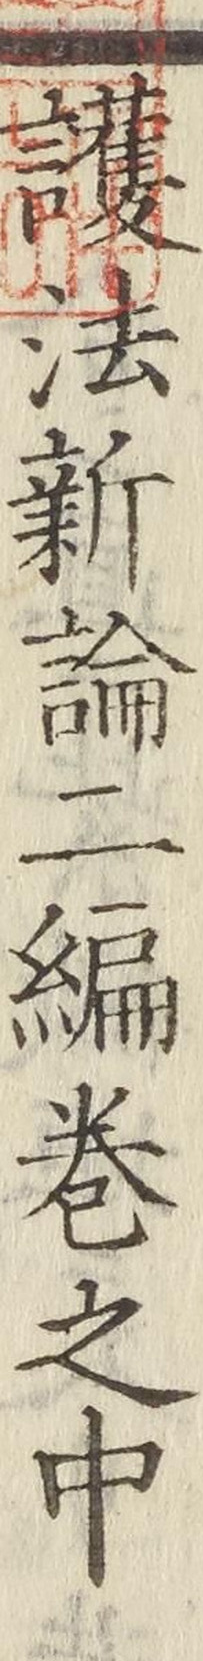護法新論二編巻之中
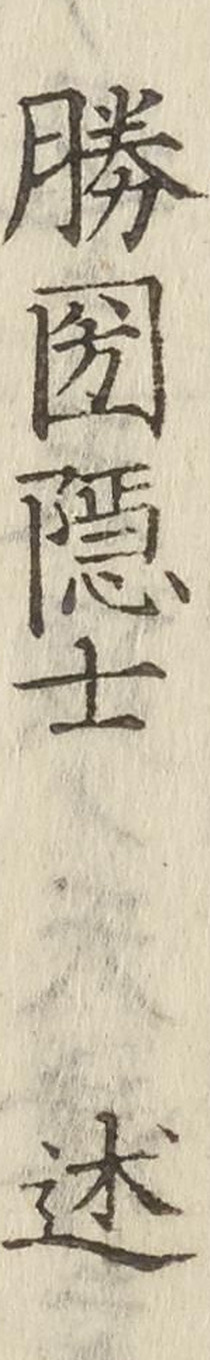勝国隠士述
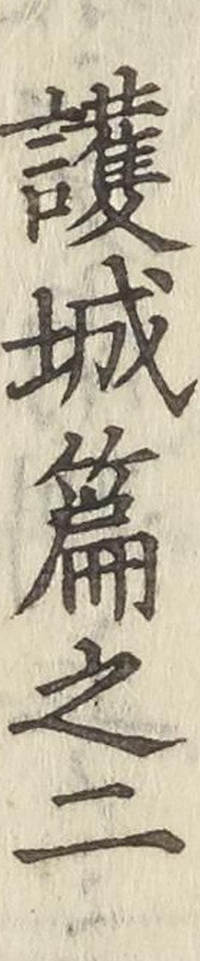護城篇之二
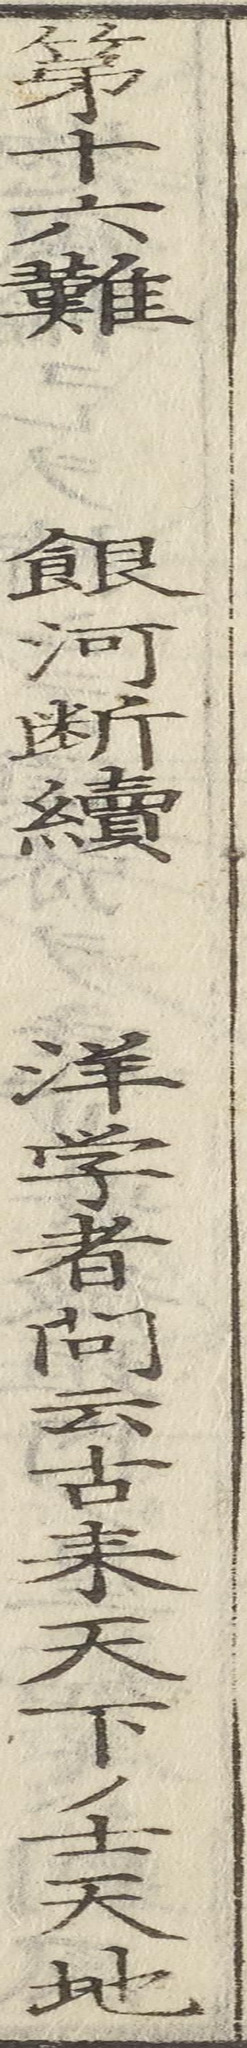第十六難銀河断続洋学者問云古来天下ノ士天地
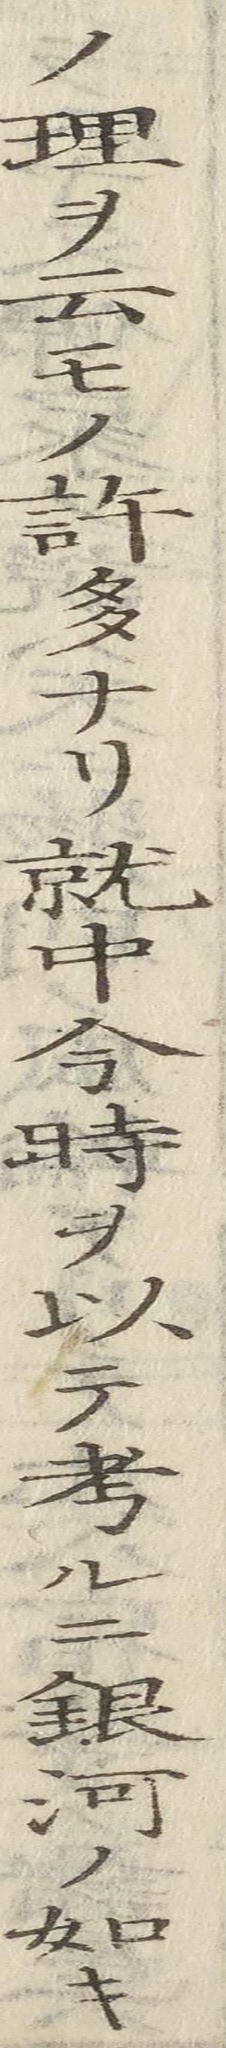ノ理ヲ云モノ許多ナリ就中今時ヲ以テ考ルニ銀河ノ如キ
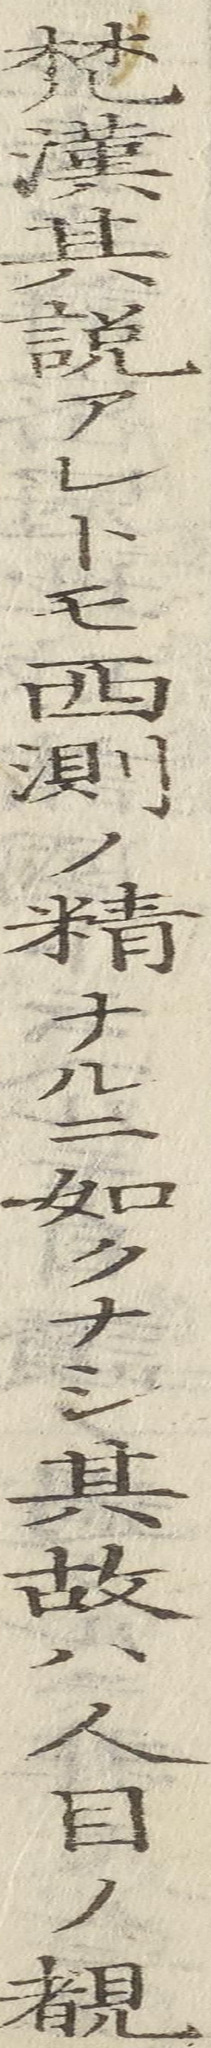梵漢其説アレトモ西測ノ精ナルニ如クナシ其故ハ人目ノ観
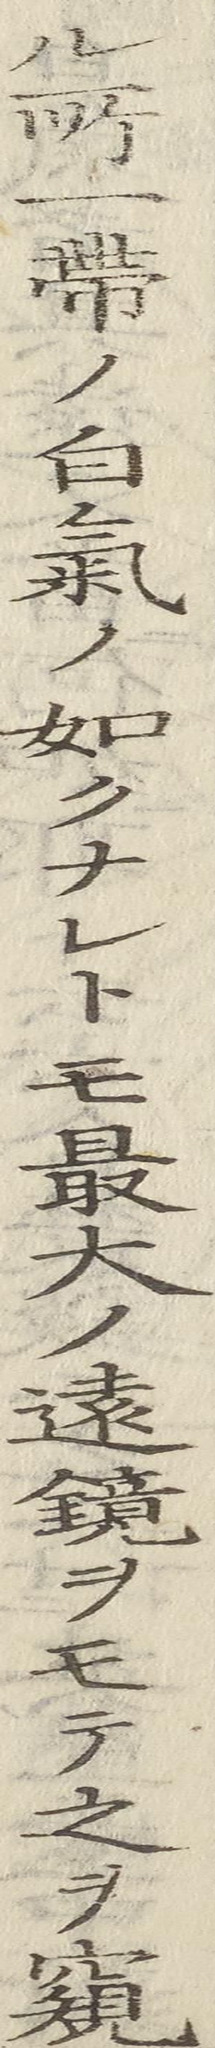ル所一帯ノ白気ノ如クナレトモ最大ノ遠鏡ヲモテ之ヲ窺
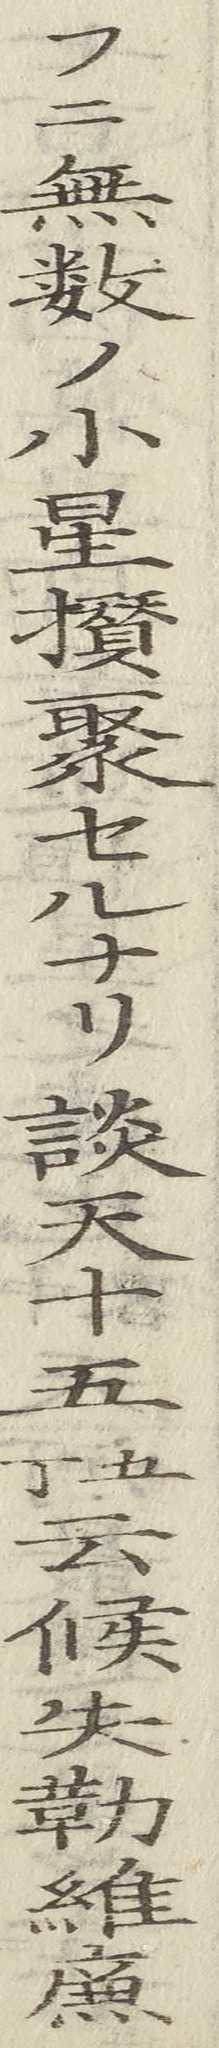フニ無数ノ小星攅聚セルナリ談天十五五丁云候失勒維廡
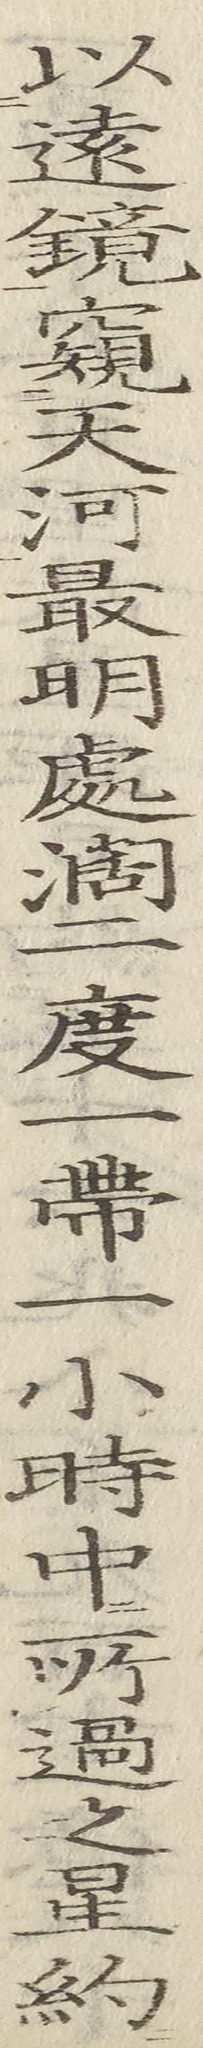以ニ遠鏡窺天河最明処濶二度一帯一小時中所過之星約
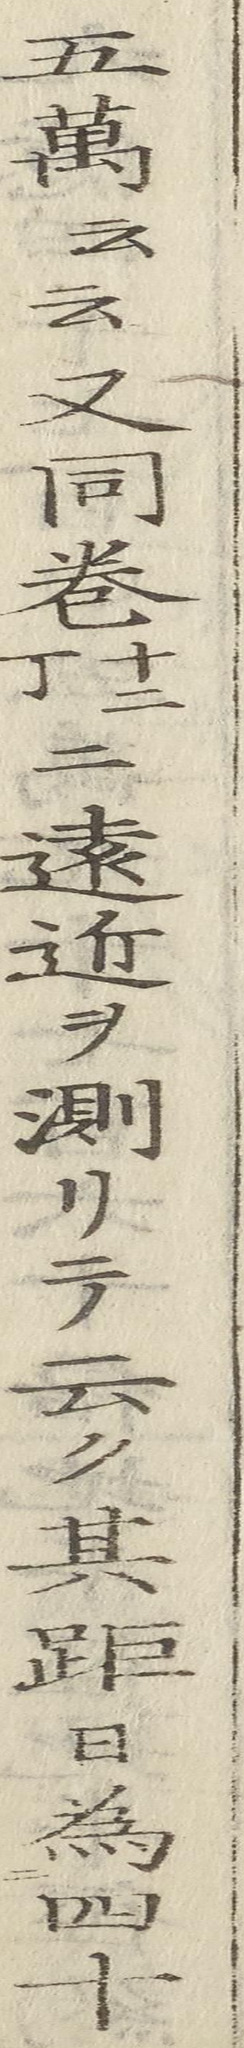五万云々又同巻十二丁ニ遠近ヲ測リテエ云ク其距日為四十

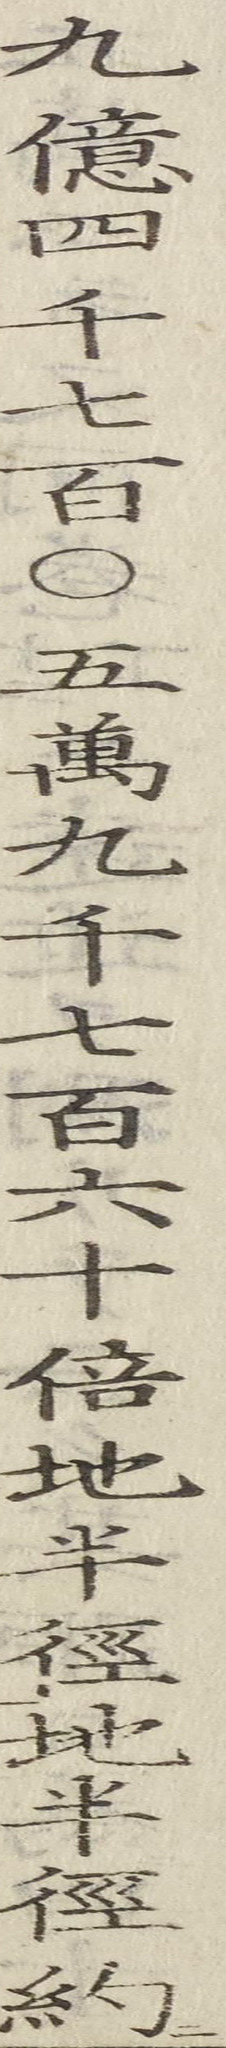九億四千七百〇五万九千七百六十倍地半径地半径約
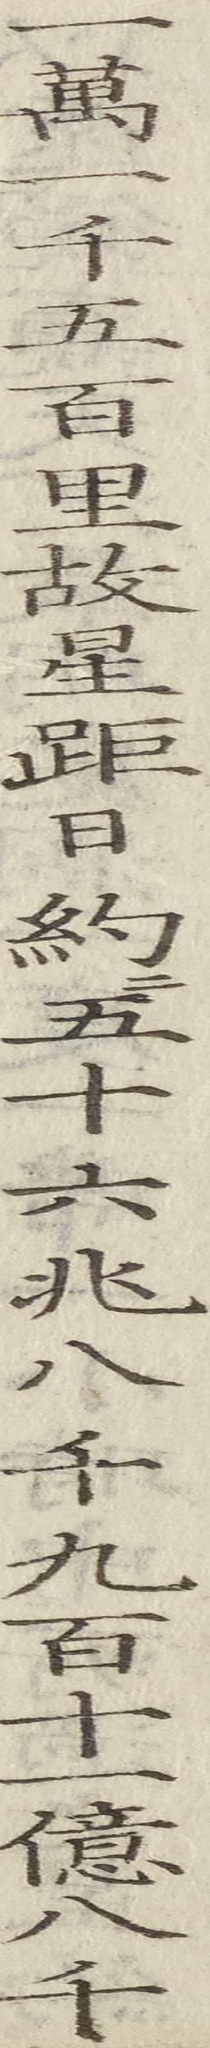一万一千五百里故星距日約五十六兆八千九百十一億八千
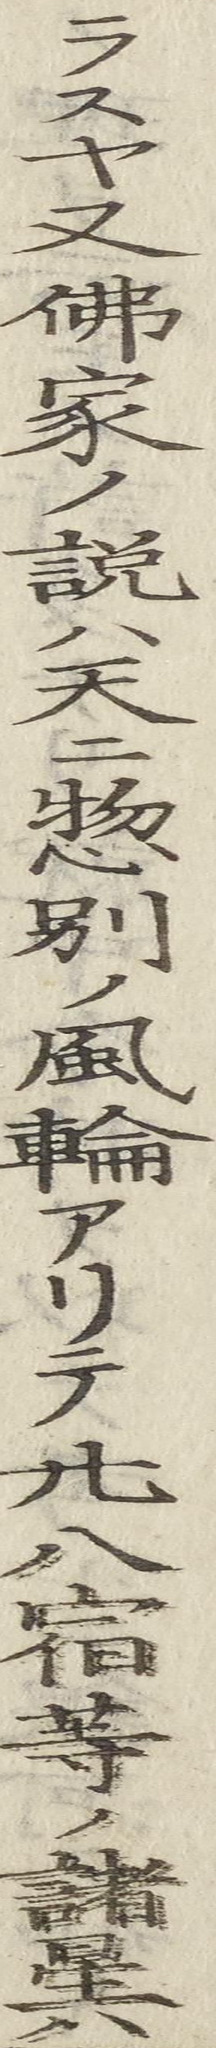ラスヤ又仏家ノ説ハ天ニ惣別ノ風輪アリテ廿八宿等ノ諸星ハ
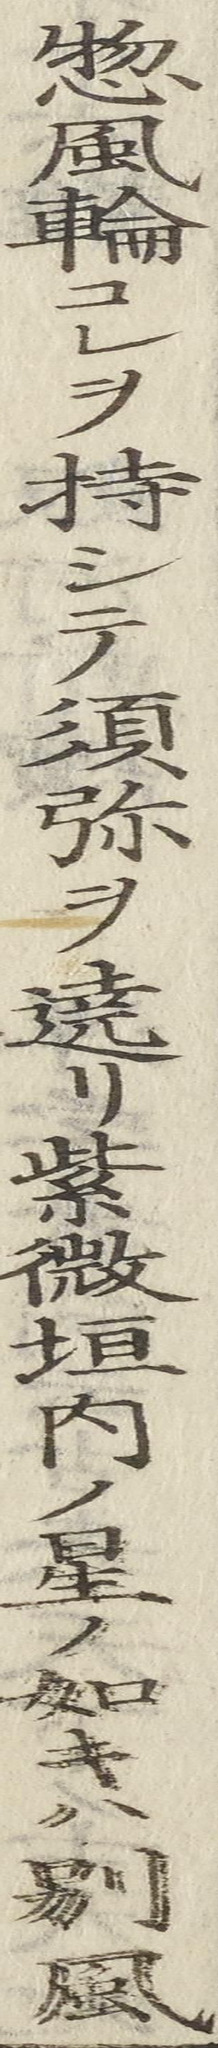惣風輪コレヲ持シテ須弥ヲ遶リ紫微垣内ノ星ノ如キハ別風
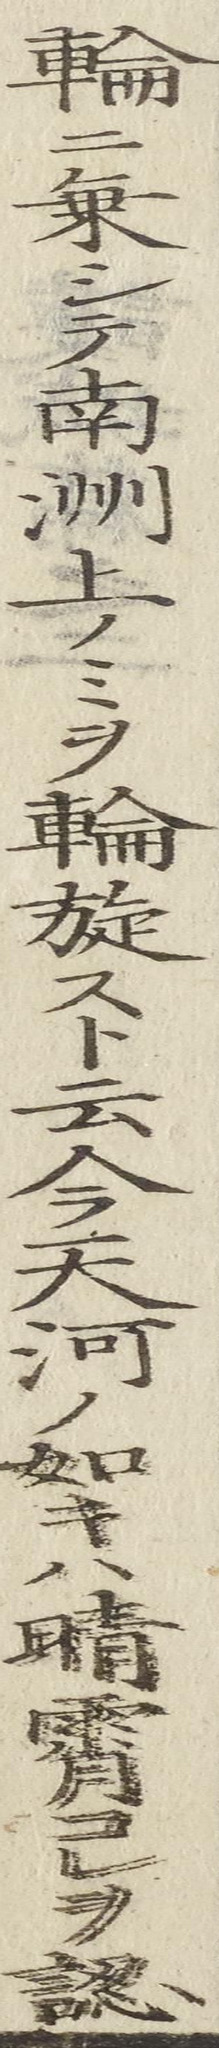輪ニ乗シテ南洲上ノミヲ輪旋スト云今天河ノ如キハ晴霄コレヲ認
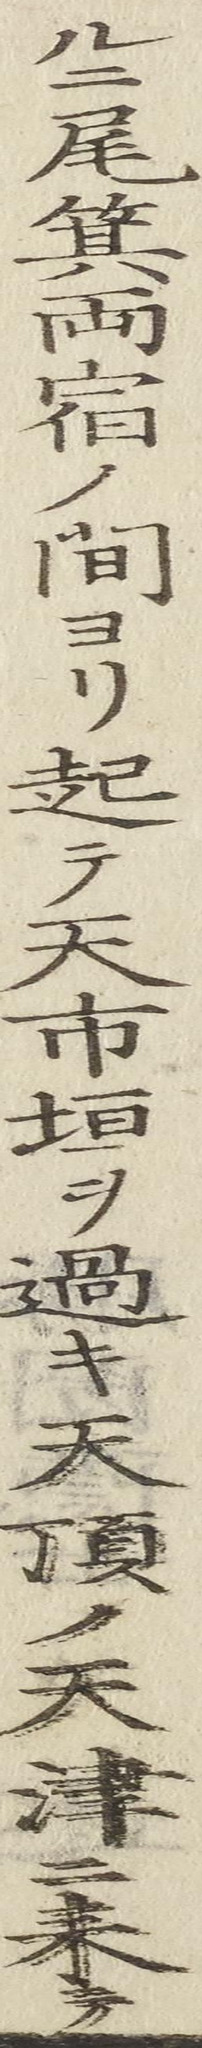ルニ尾箕両宿ノ間ヨリ起テ天市垣ヲ過キ天頂ノ天津ニ来テ
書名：護法新論　二編　中
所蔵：東京大学地震研究所図書室 Earthquake Research Institute Library, The University of Tokyo, JAPAN
